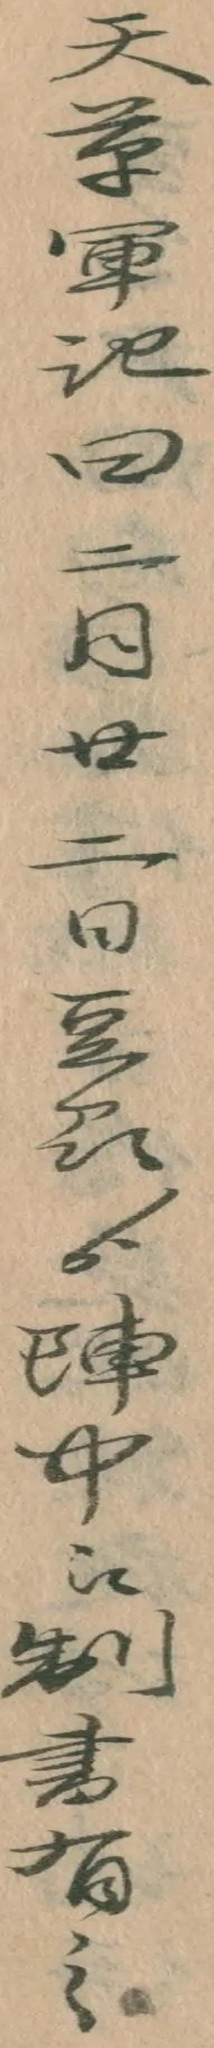天草軍記曰二月廿二日豆州ゟ陣中江制書有之
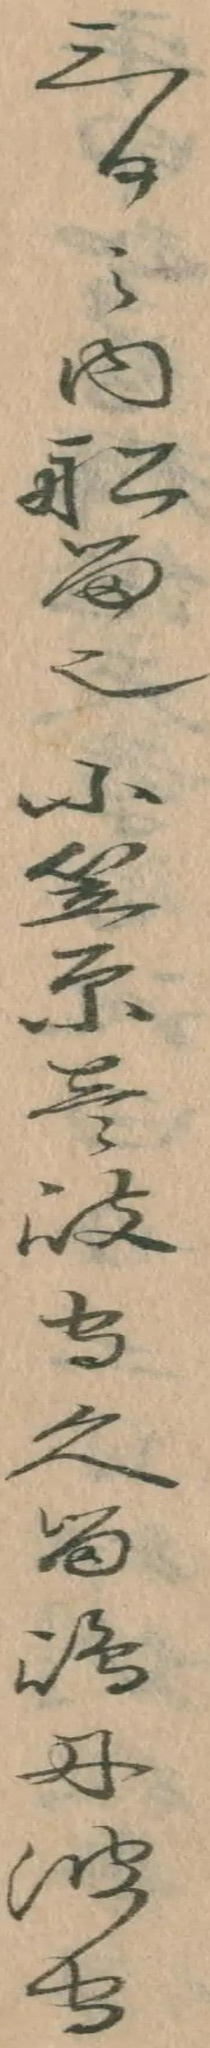三日之内舩留也小笠原壱岐守久留島丹波守
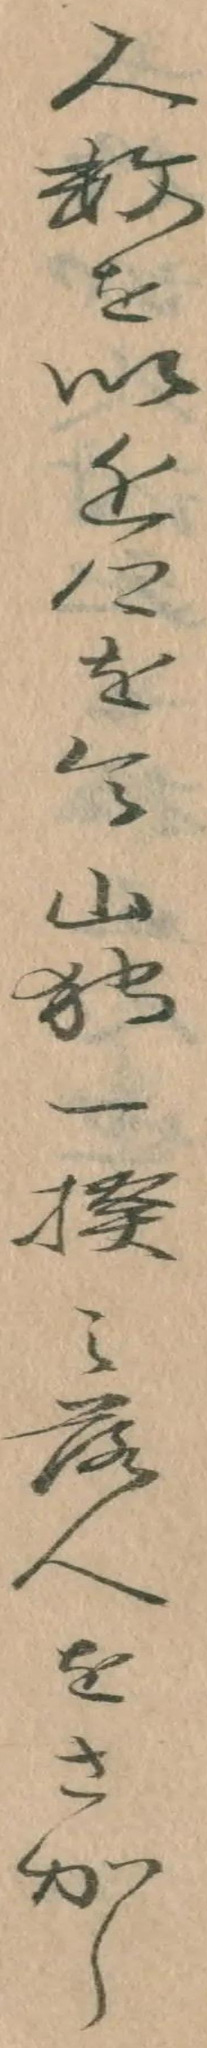人数を以近郷を令山狩一揆之落人をさ加し
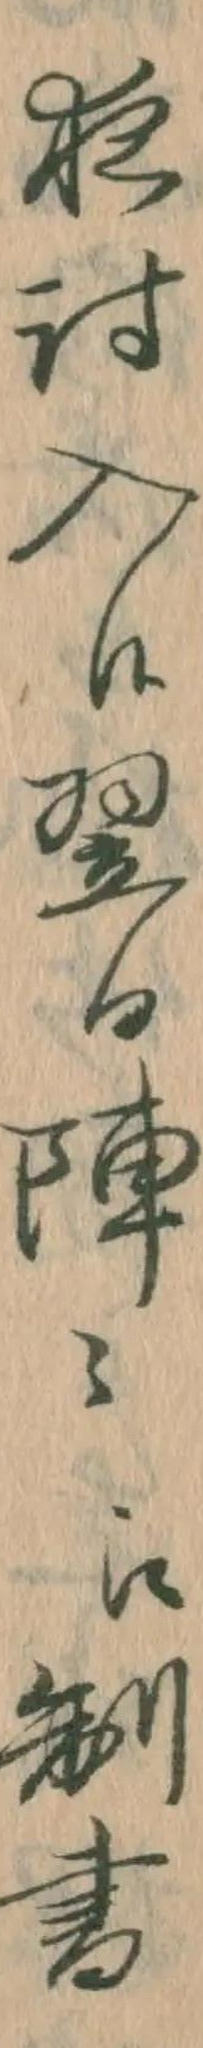夜討入候翌日陣々江制書
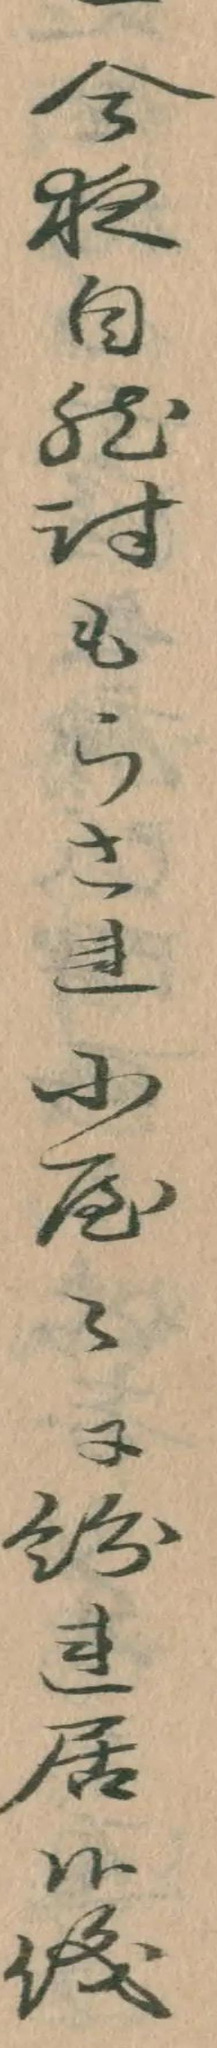一今夜自然討もらさ連小屋々尓紛連居候儀
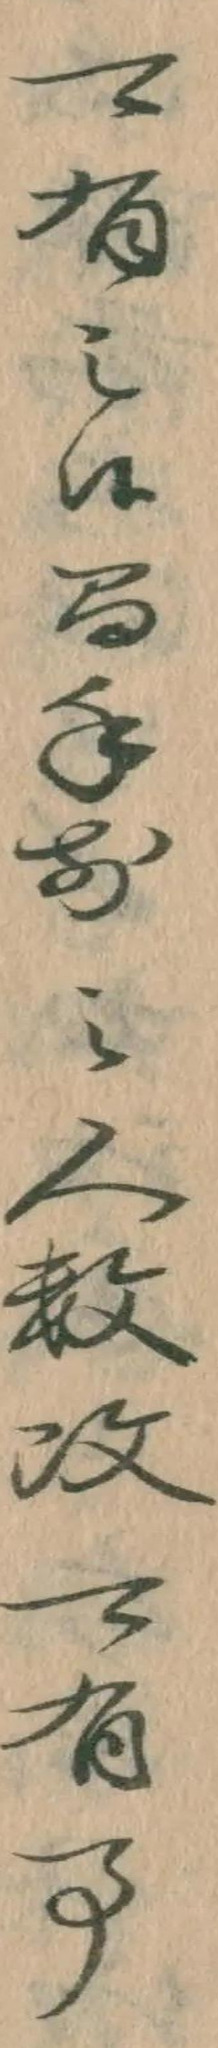可有之候間手前之人数攻可有事
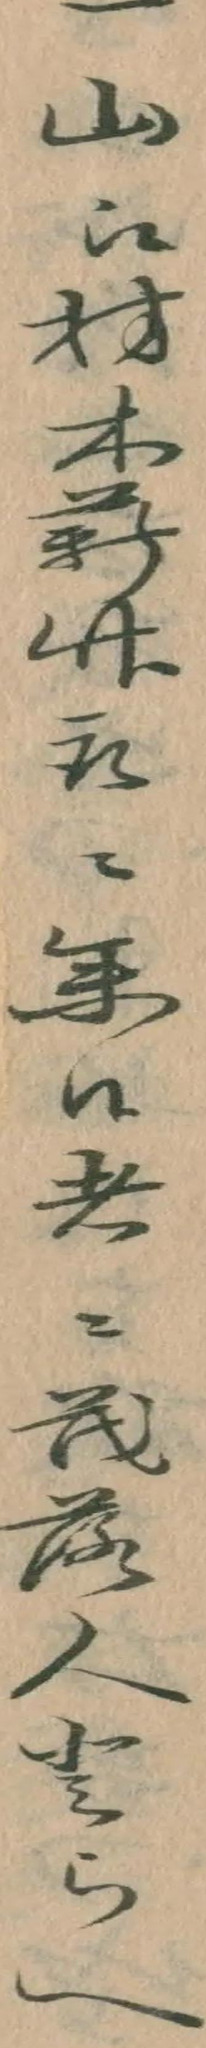一山江材木薪竹取に参候者に茂落人登らへ
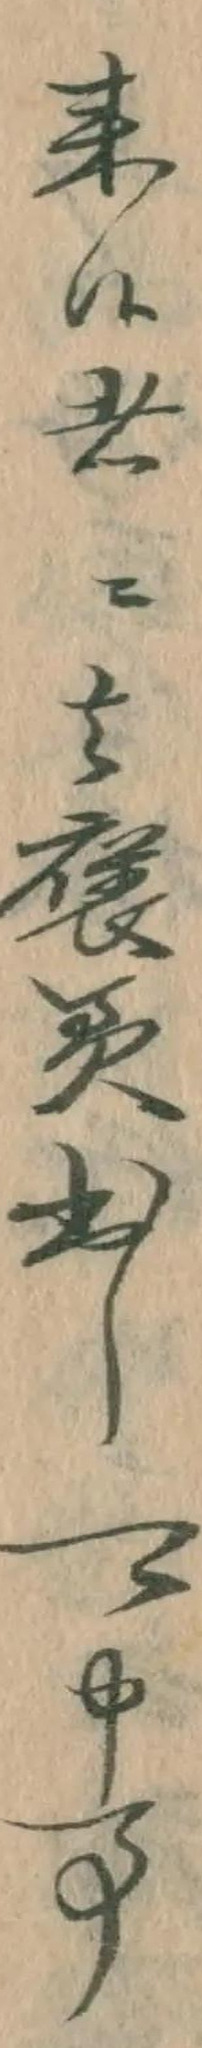来候者に者褒美出し可申事
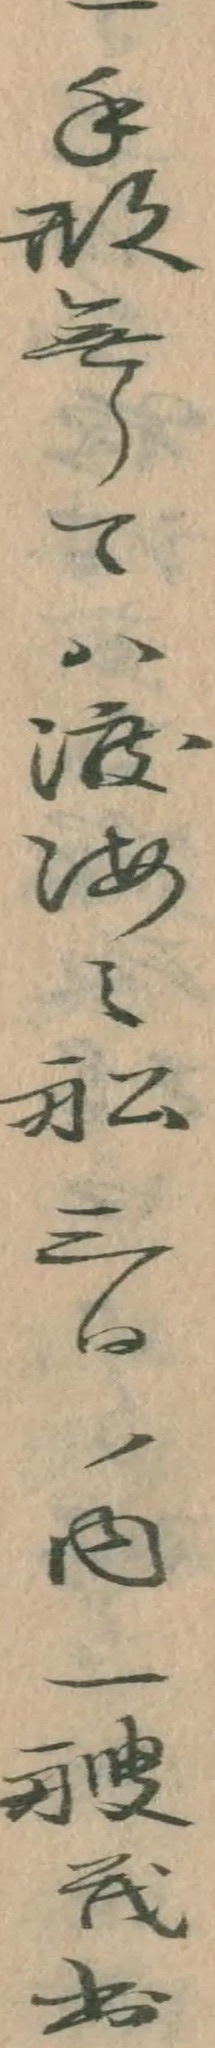一手形無しては渡海之舩三日之内一艘茂出
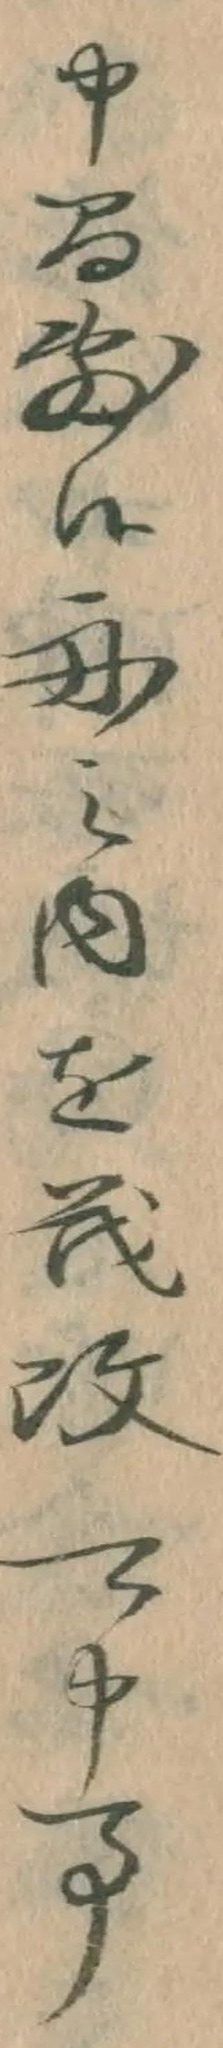申間敷候舟之内を茂攻可申事
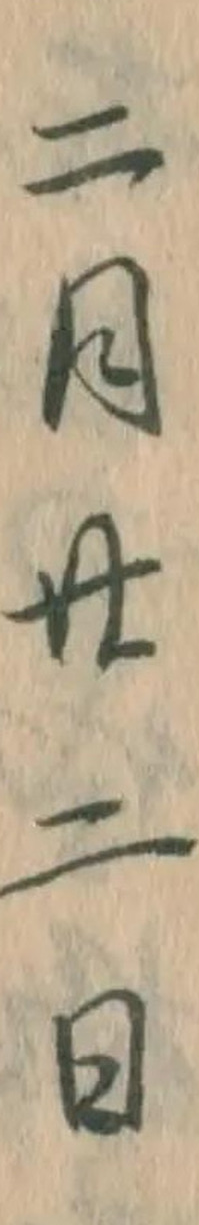二月廿二日
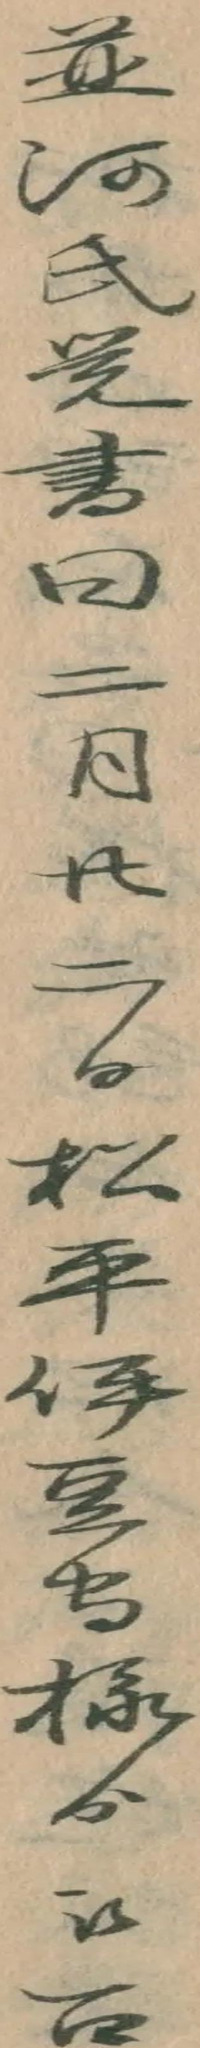並河氏覚書曰二月廿二日松平伊豆守様与被召
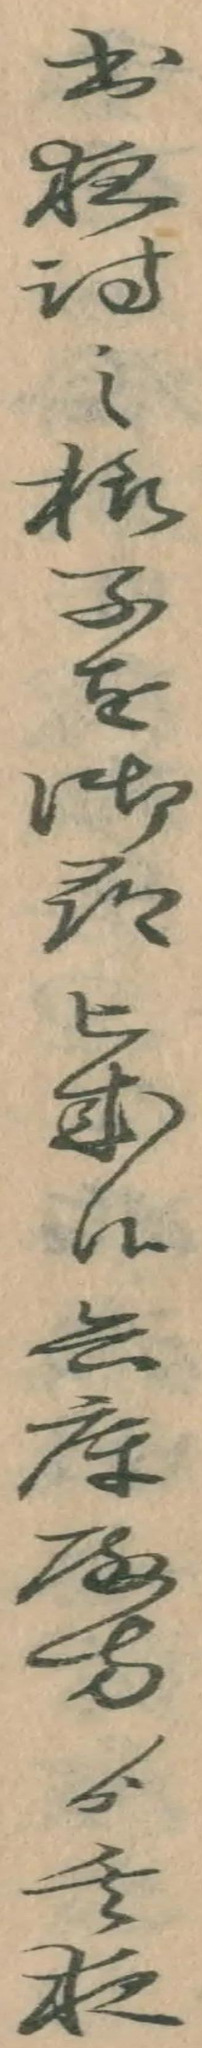出夜討之様子を御尋被成候兵庫殿方ゟ其夜

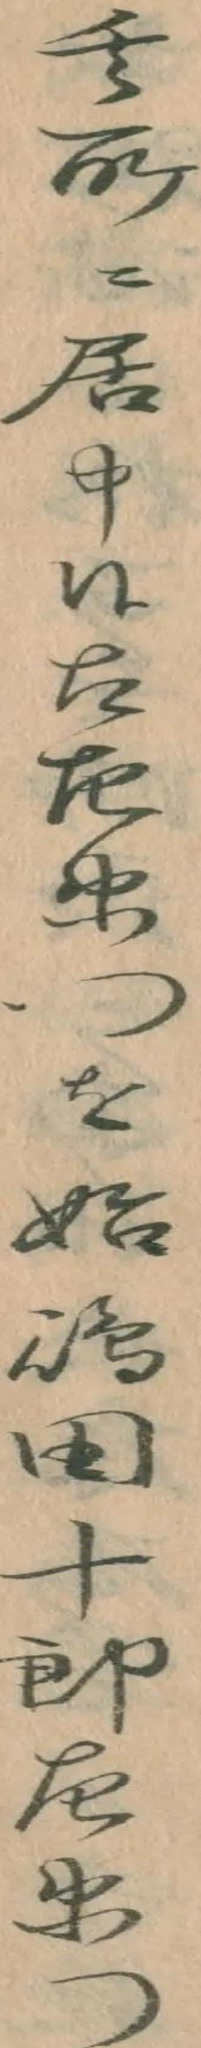其所に居申候太左衛門を始島田十郎左衛門
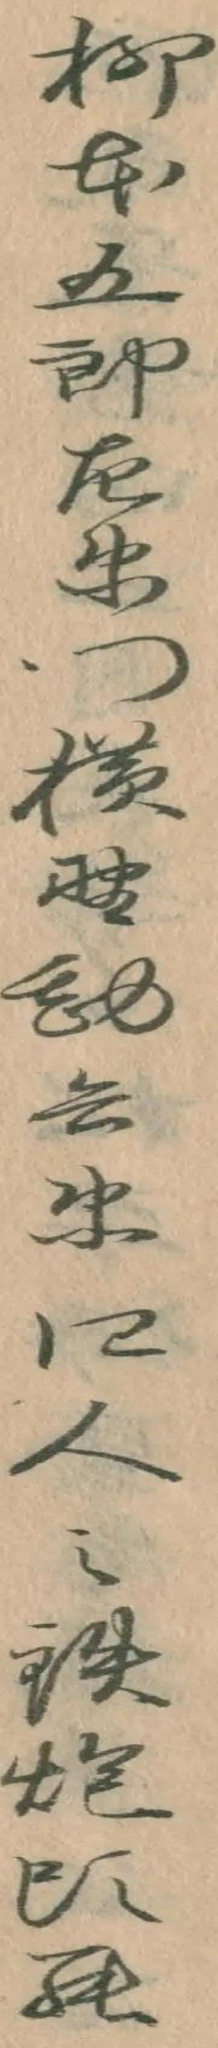柳本五郎左衛門横野勘兵衛四人之鉄炮頭罷
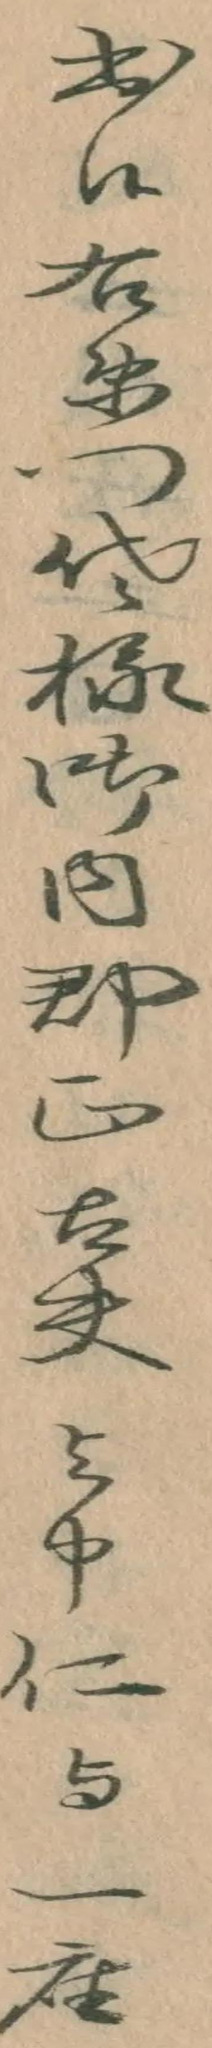出候右衛門佐様御内郡正太夫与申仁与一座
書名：切支丹御退治記 49巻. [7]
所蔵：国立国会図書館 National Diet Library, JAPAN
